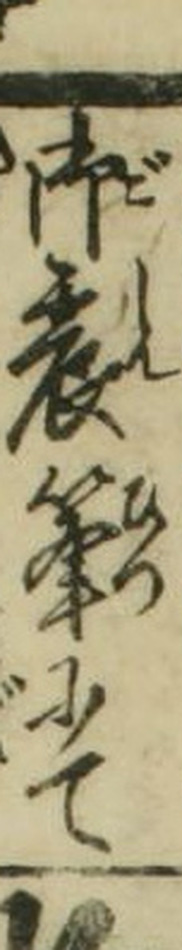御宸筆にて
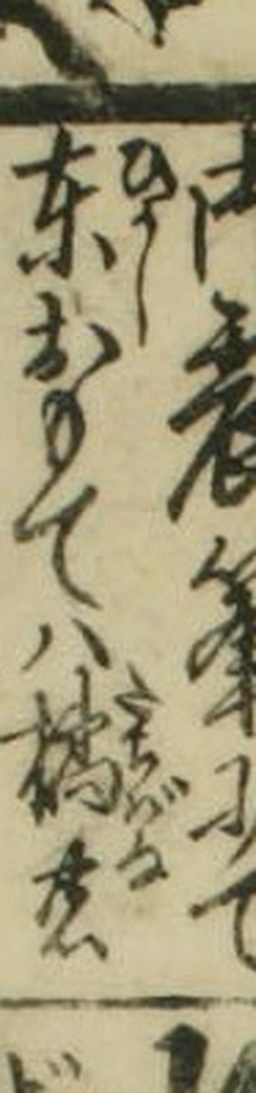東おもては橘の
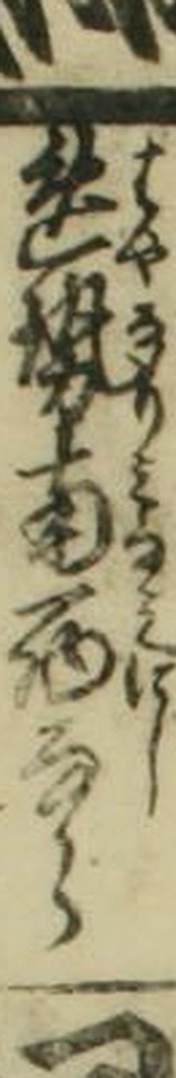速勢南西なら
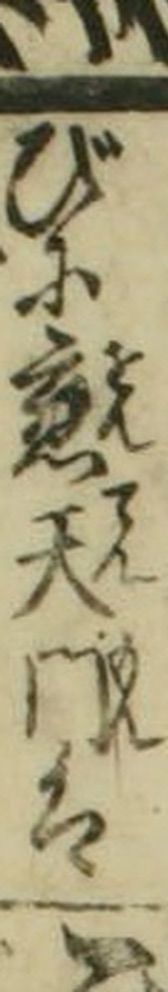びに應天門は
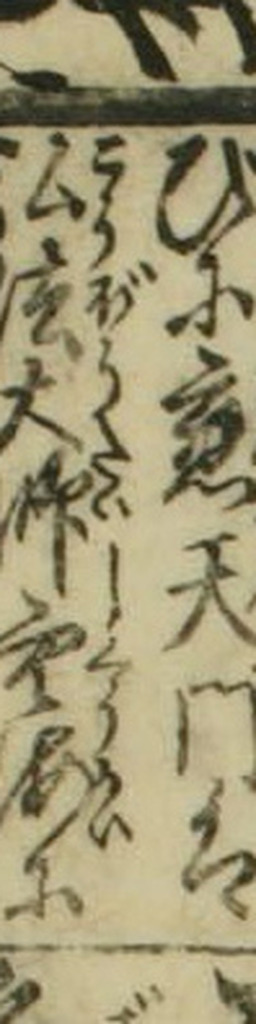弘法大師空海に
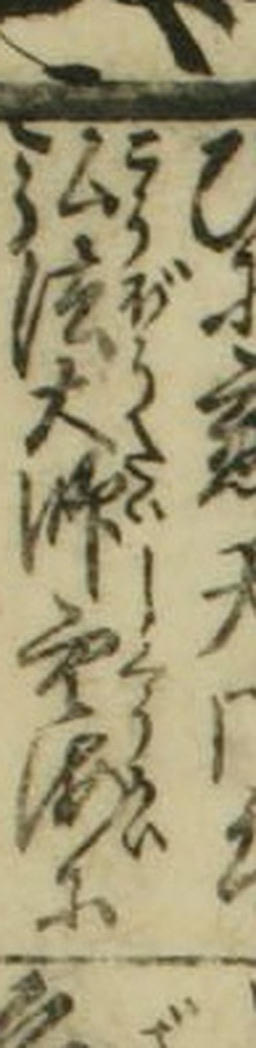弘法大師空海に
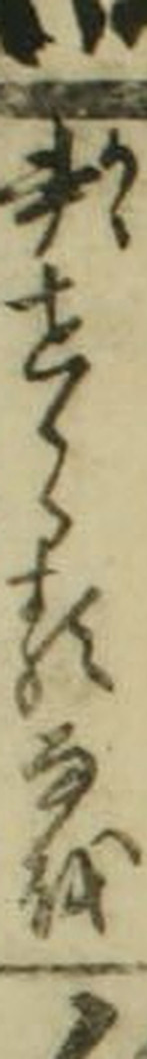書せらるなを
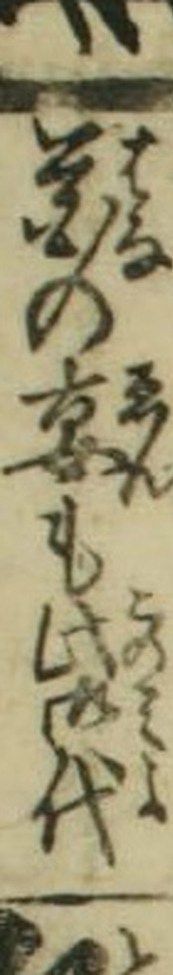花の宴も此御代
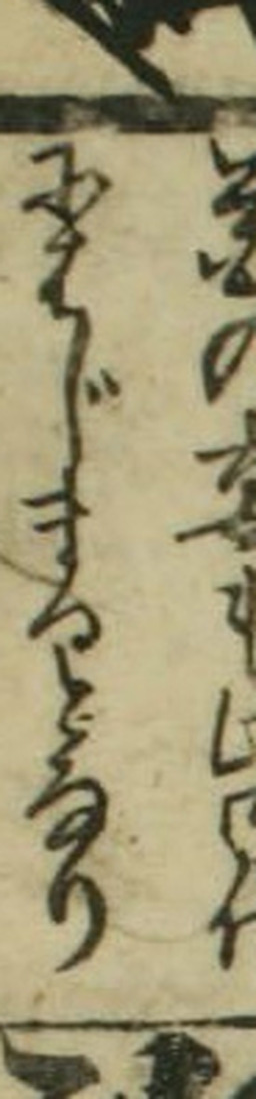にはじまるとなり

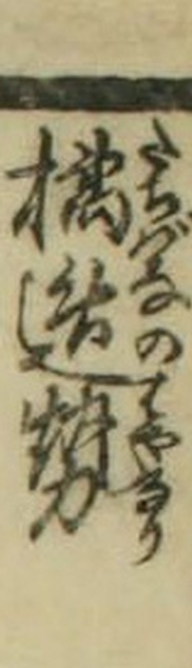橘逸勢
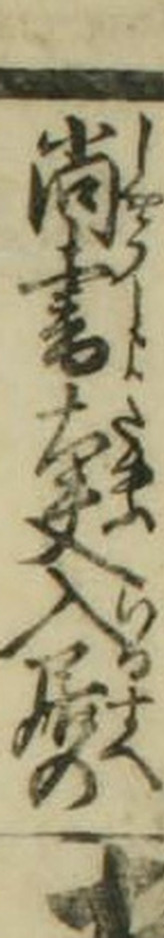尚書太夫入居の
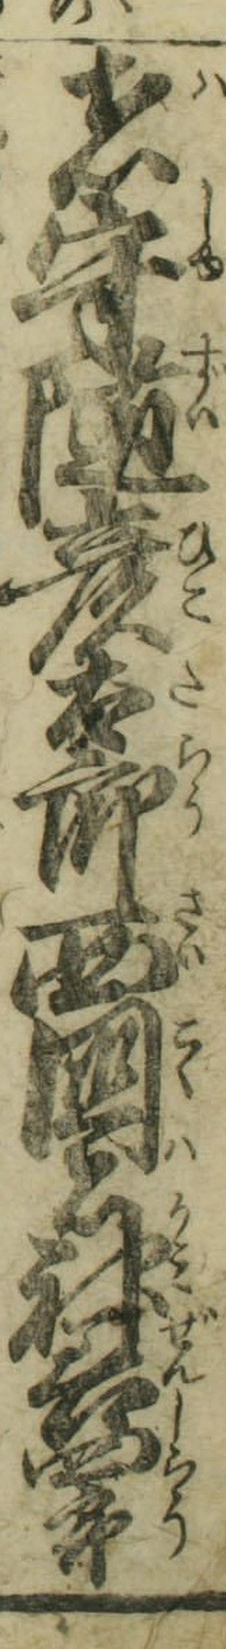者守随彦太郎西国者神善四郎
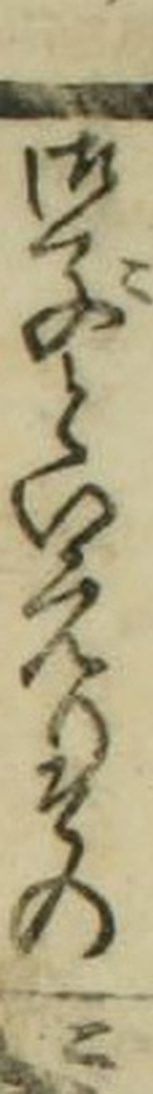御子といえりその
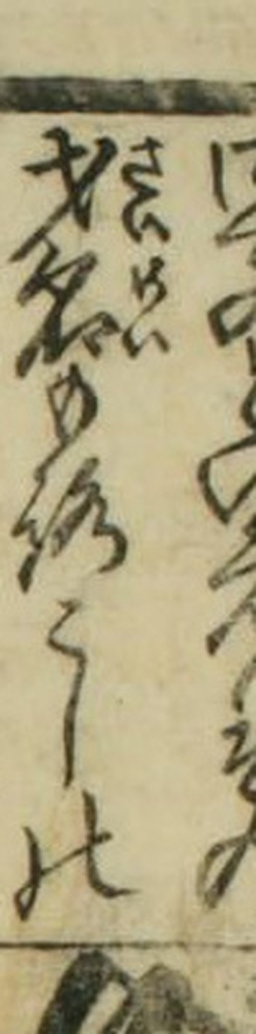才名もろこしの
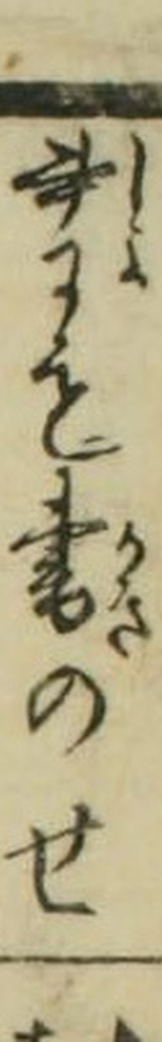書にも書のせ
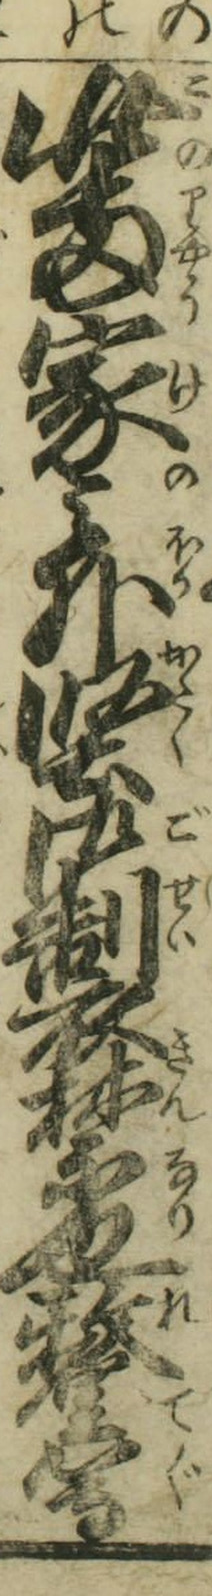此両家之外堅御製禁也釐等
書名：増補職人往来
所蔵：東京学芸大学教育コンテンツアーカイブ
